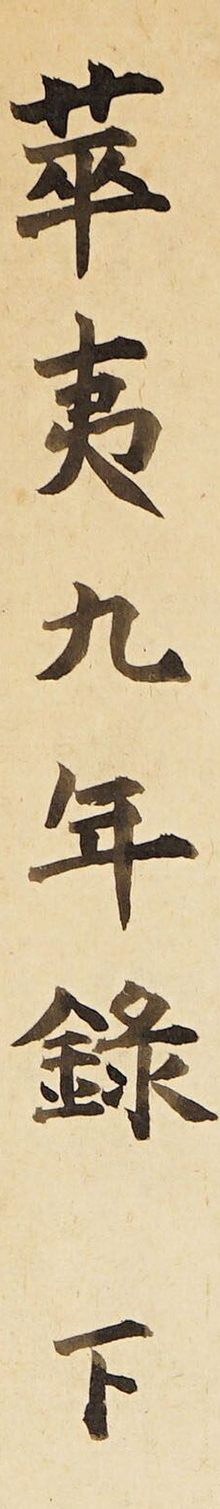華夷九年録下
